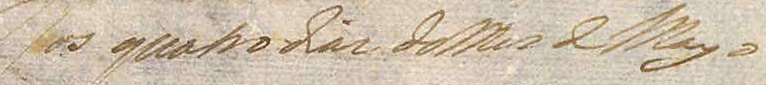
os quatro diaz do mez de Mayo
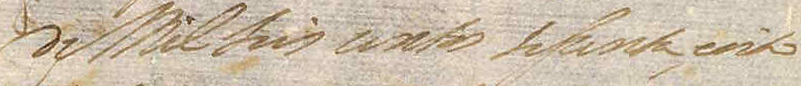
de Mil seiscentos sessenta, e oito
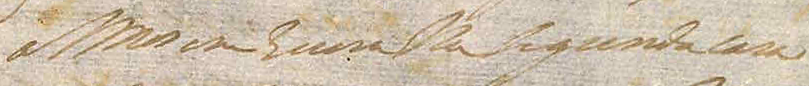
annos em Euora Na segunda caza
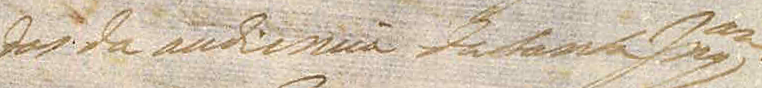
das da audiencia de santa Inqam.
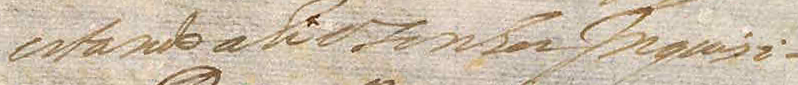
estando ahi o senhor Inquizi
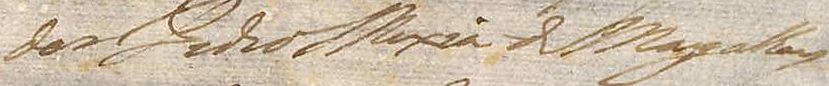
dor Pedro Mexia de Magalhais
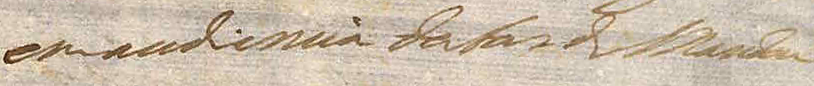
em audiencia da tarde mandou
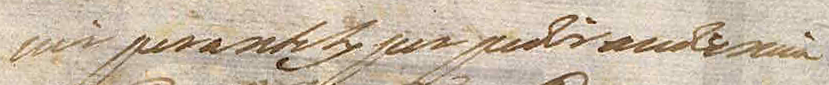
uir perante sy per pedir audiencia
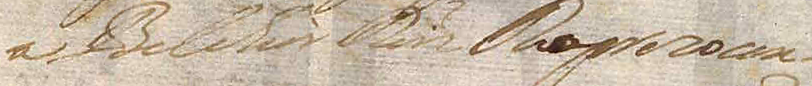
a Belchior Roīz Reo prezo con
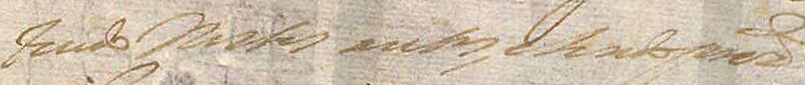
teudo Nestes autos, e sendo prezte.
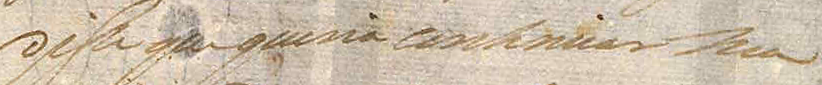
disse que queria continuar sua
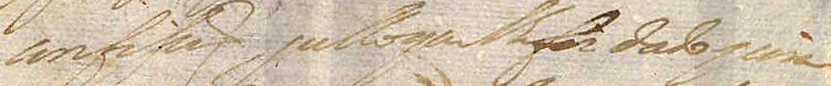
confissão, pello que lhe foi dado jura
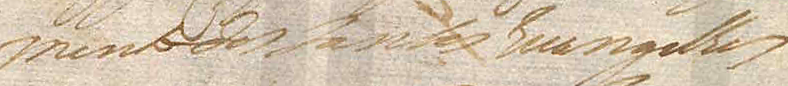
mento dos Santos Euangelhos
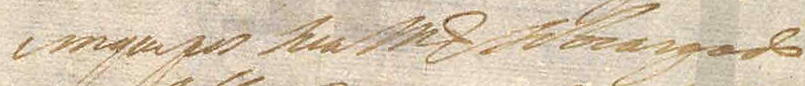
em que pos sua mão sob cargo do
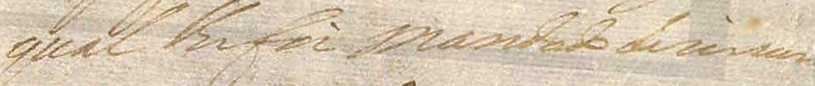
qual lhe foi mandado dizer ver
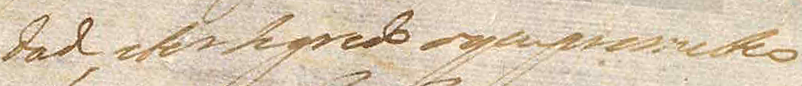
dade, e ter segredo o que prometeo
